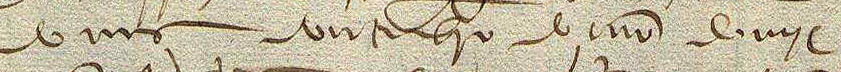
do mes doutubro do an̄o de mjl
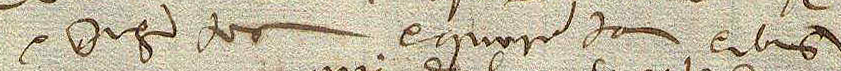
e q̄nhētos e quorēta e dous
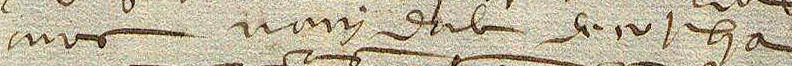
anos na cydade de coJnbra
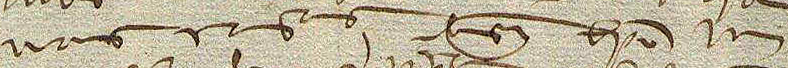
nas casas do s̄or bpō Jm
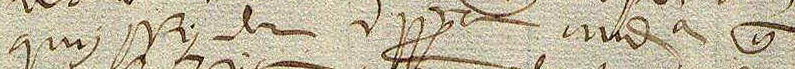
quyssydor ē ꝓpca audja q̄
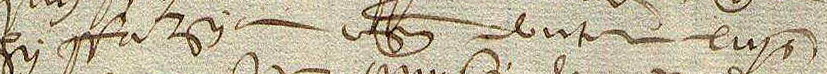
hy ffazya o s̄or doutor lujs
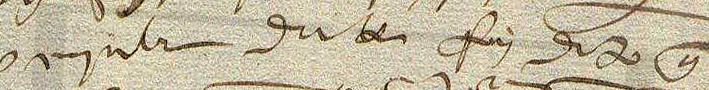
ꝓcurador da Re foy dito q̄
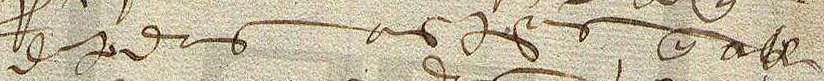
de todas as tas e q̄ a Re
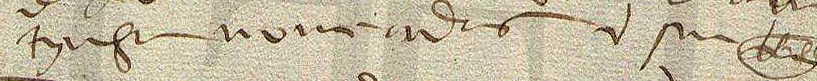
tynha nomeadas ē seu Roll
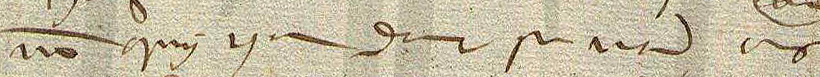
no quyrja dar senā as
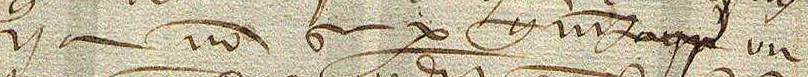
rja n̄o se ꝑgūtar ou
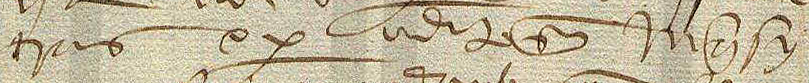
tras e ꝑ o dito s̄or Jnq̄sy
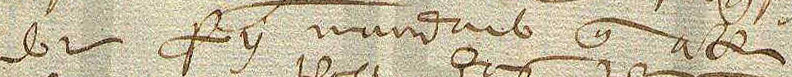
dor foy mandado q̄ a Re
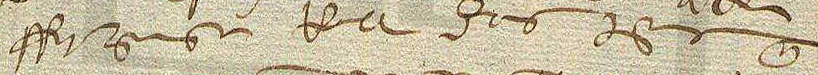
ffyzese Roll das tas q̄
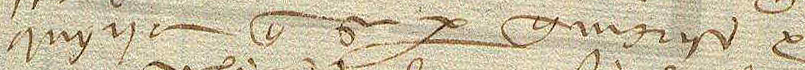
quyrja q̄ se ꝑguntasē e
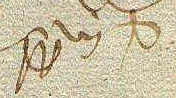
esp̄vy
